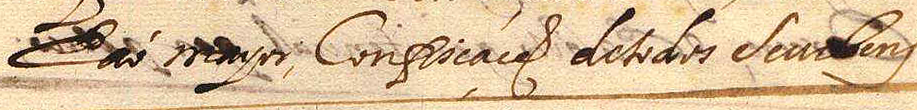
haõ mayor, Confiscaçaõ de todos Seus bens
